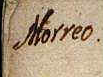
Morreo.
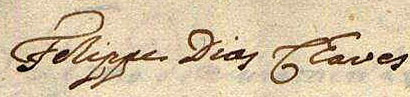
Felippe Dias Chaves
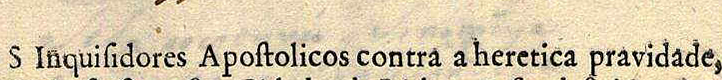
S Inquisidores Apostolicos contra a heretica pravidade,
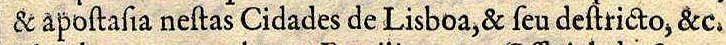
& apostasia nestas Cidades de Lisboa, & seu destricto, &c.
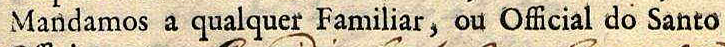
Mandamos a qualquer Familiar, ou Official do Santo
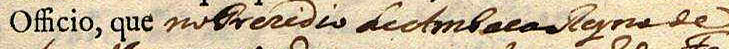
Officio, que no Prezidio de Ambaca Reyno de
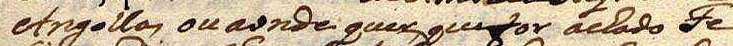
Angolla ou aonde quer, que for achado Fe
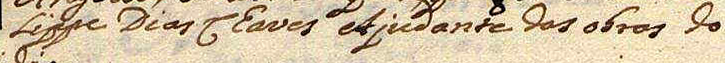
Lippe Dias Chaves Ajudante das obras do
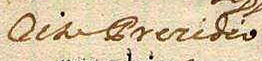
dito Prezidio
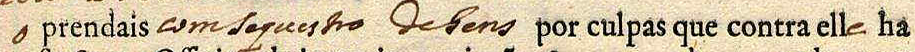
o prendais com sequestro de bens por culpas que contra elle ha
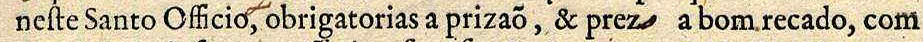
neste Santo Officio, obrigatorias a prizaõ, & prezo a bom recado, com
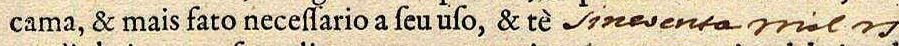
cama, & mais fato necessario a seu uso, & tè sincoenta mil rs
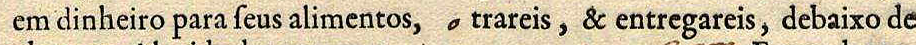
em dinheiro para seus alimentos, o trareis, & entregareis, debaixo de
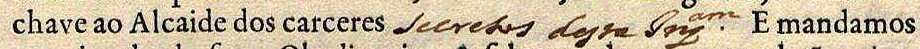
chave ao Alcaide dos carceres secretos desta Inq.am E mandamos
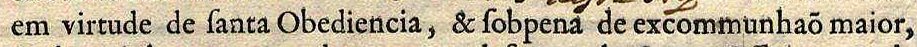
em virtude de santa Obediencia, & sob pena de excommunhaõ maior,
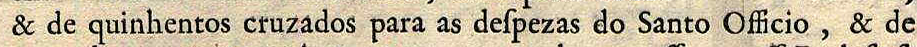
& de quinhentos cruzados para as despezas do Santo Officio, & de
